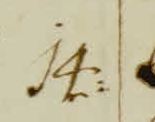14:
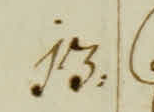13:
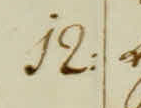12:
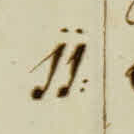11:
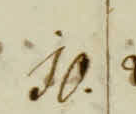10.
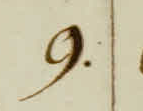9.
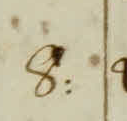8:
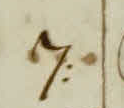7:
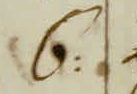6:
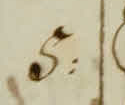5:
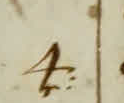4:
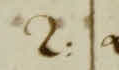2:
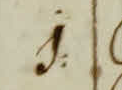1:
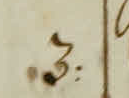3:
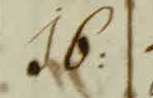16:
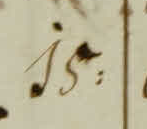15:
